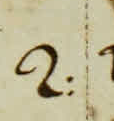2:
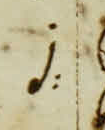1:
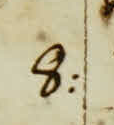8:
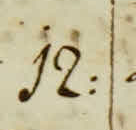12:
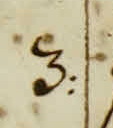3:
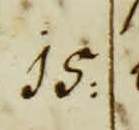15:
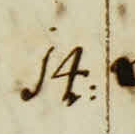14:
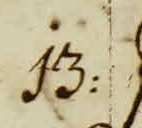13:
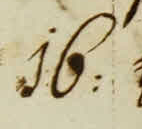16:
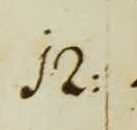12:
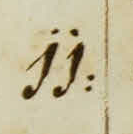11:
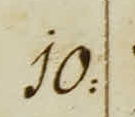10:
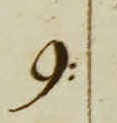9:
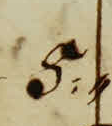5:
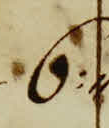6:
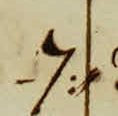7:
